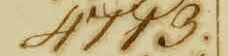4713.
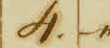4.
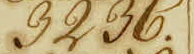3236.
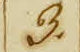3.
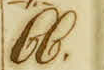66.
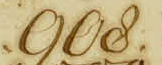908.
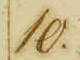10.
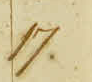17.
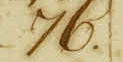76.
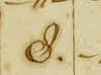8.
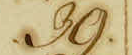39.
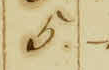5.
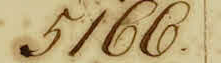5166.
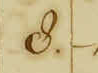8.
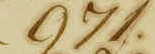971.
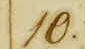10.
